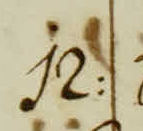12:
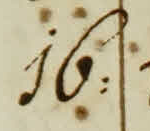16:
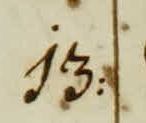13:
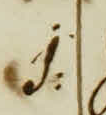1:
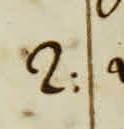2:
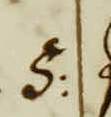5:
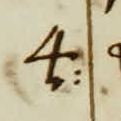4:
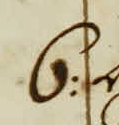6:
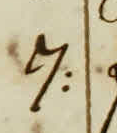7:
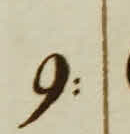9:
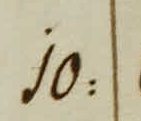10:
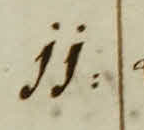11:
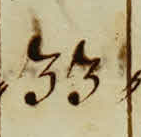33
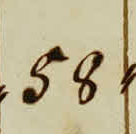58
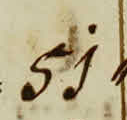51
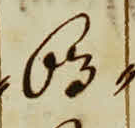63
